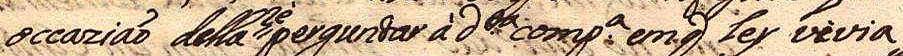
occaziaõ della // ré perguntar à d.ta comp.a em q̄ ley vivia
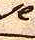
se
